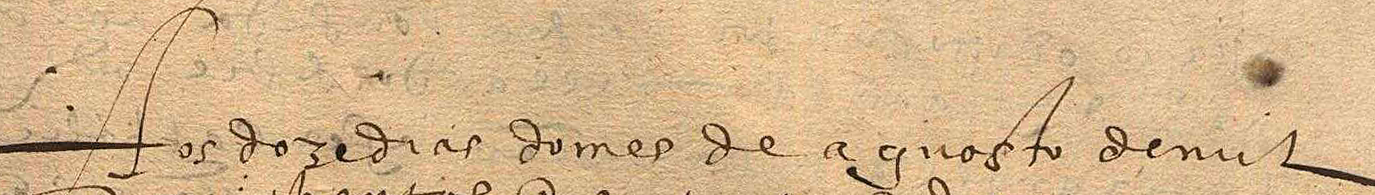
Aos doze dias do mes de aguosto de miL
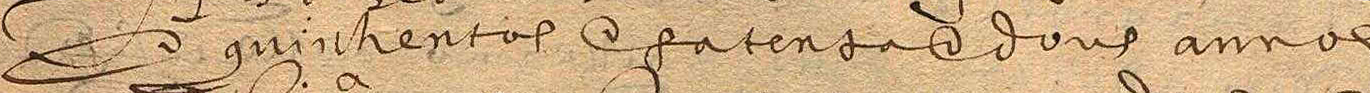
e quinhentos e satenta e dous annos
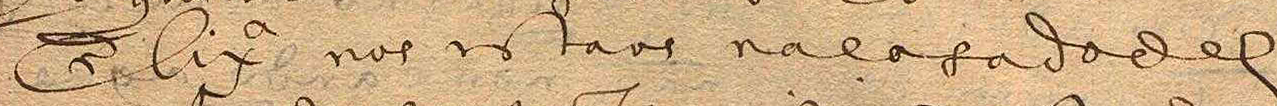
ē lixa nos estaos na casa do des
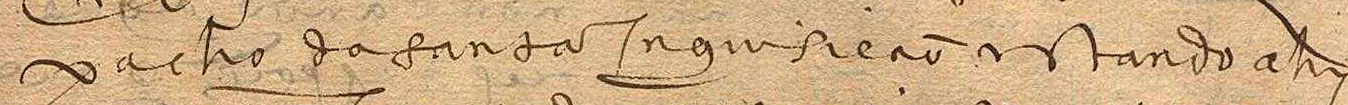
pacho da santa Jnquisição estando ahy
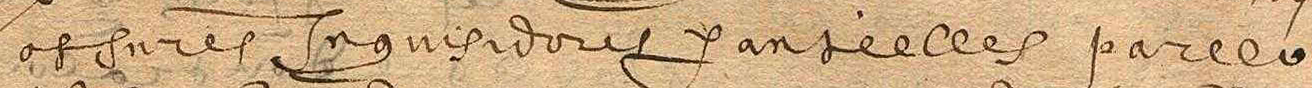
os snr̄es Jnquisidores ꝑante elles pareceo
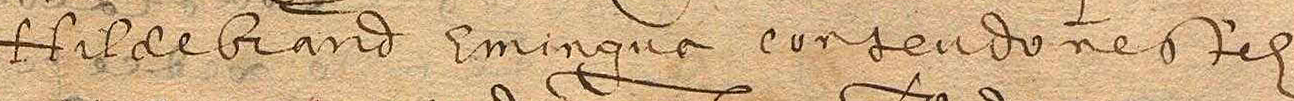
Hildebrand Emingua conteudo nestes
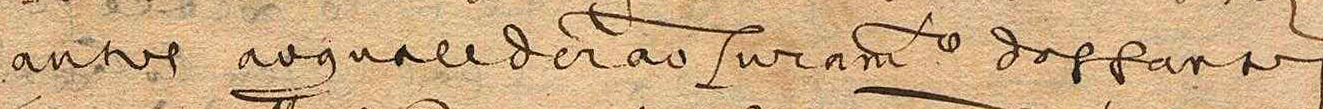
autos ao quall dei ao Juramto dos santos
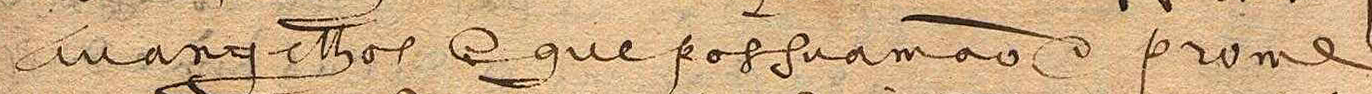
auangelhos e que pos sua mão e prome
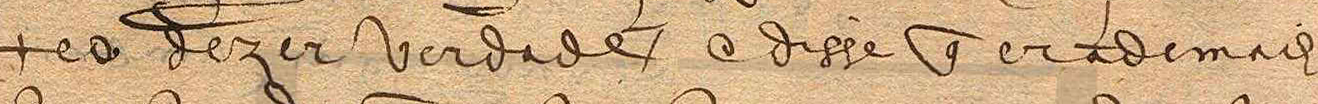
teo dezer verdade / e disse q̄ era de mais
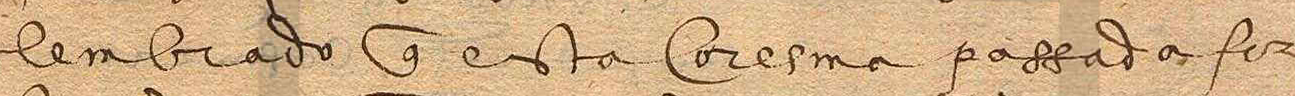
lembrado q̄ esta Coresma passada fez
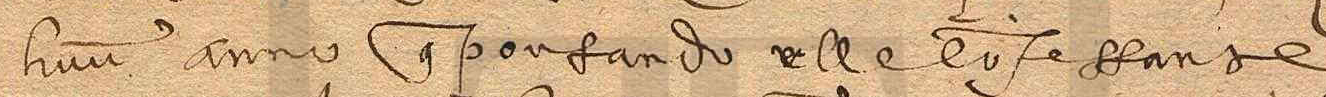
hūu anno q̄ pousando elle cōfessante
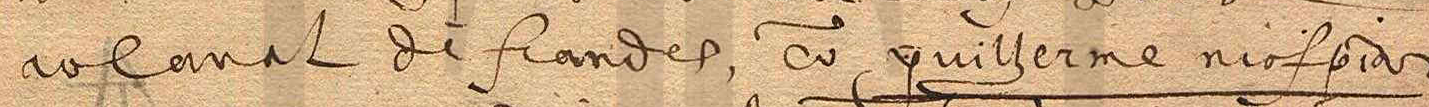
ao Canal de frandes, cō guilherme niof pītor
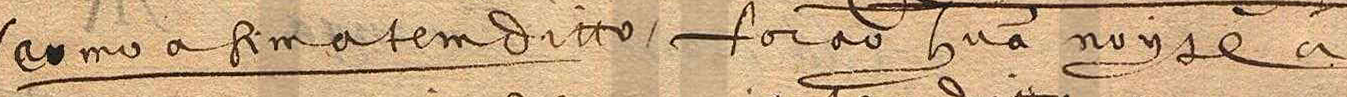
como asima tem ditto / forão huā noyte a
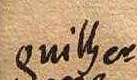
guilher
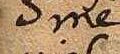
me
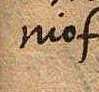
niof
